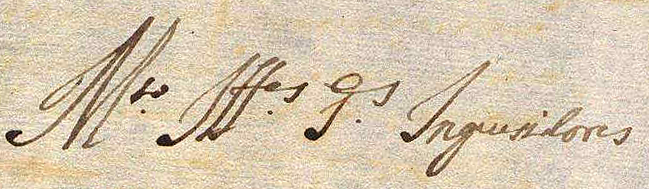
Mt.to Ill.es S.rs Inquisidores
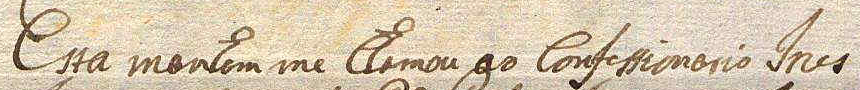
Esta manham me Chamou ao Confessionario Ines
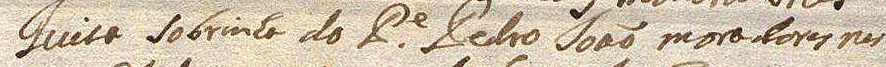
Luisa sobrinha do P.e Pedro Ioaõ moradores nes
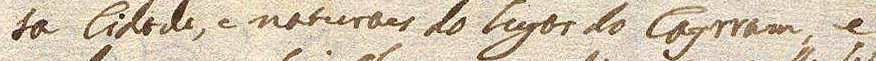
ta Cidade, e naturaes do lugar do Cayrram, e
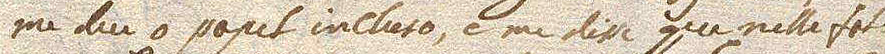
me deu o papel incluso, e me disse que nelle fal
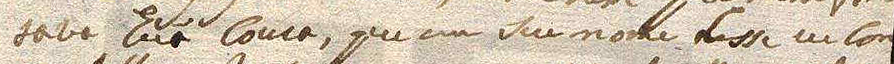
tava huā Cousa, que em seu nome desse eu Con
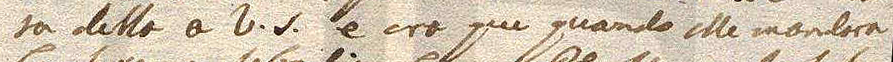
ta della a V. s. e era que quando elle mandara
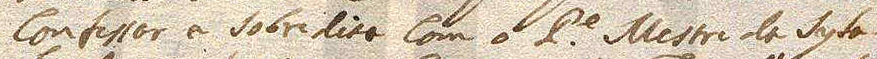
Confessar a sobredita Com o P.e Mestre da Syla
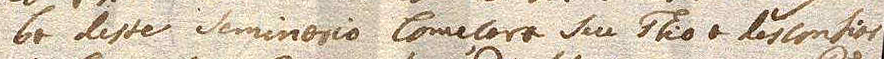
ba deste seminario Começara seu Thio a desconfiar
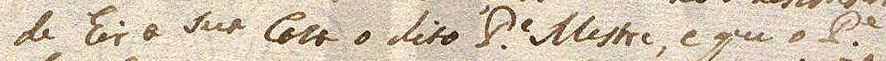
de hir a sua Caza o dito P.e Mestre, e que o P.e
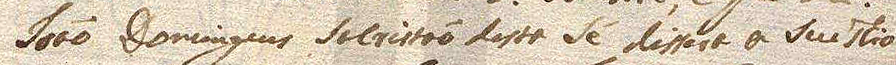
Ioaõ Domingues sacristaõ desta Sé dissera a seu Thio
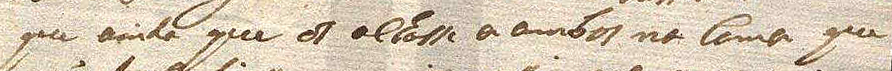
que ainda que os achasse a ambos na Cama que
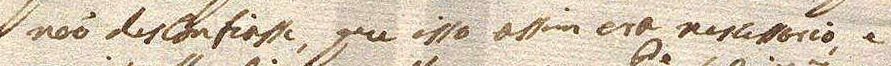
naõ desconfiasse, que isso assim era nescessario, e
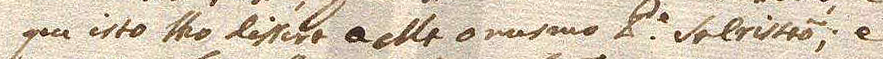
que isto lho dissera a ella o mesmo P.e SaCristaõ; e
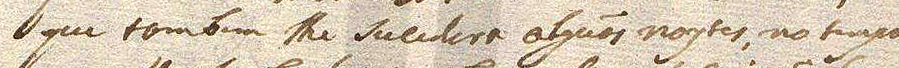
que tambem lhe sucedera alguās noytes, no tempo
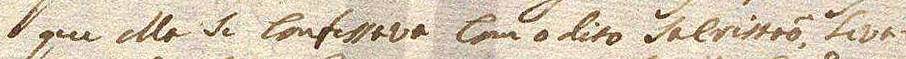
que ella se Confessava Com o dito sacristaõ, Leva
